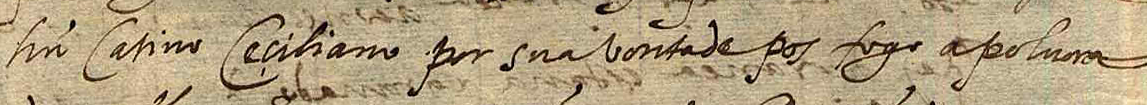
hū Catiuo Ceçiliano por sua vontade pos fogo a poluora
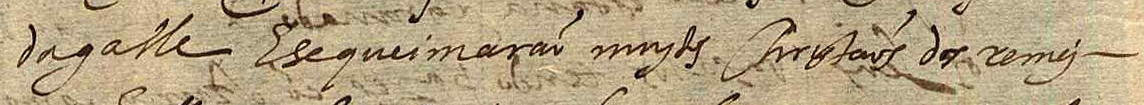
da galle E se queimaraõ mujtos Christaõs dos remej
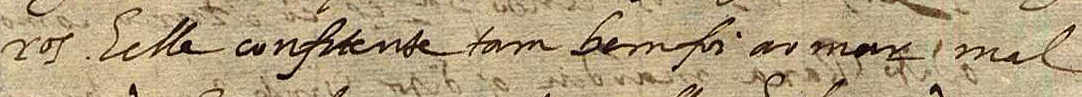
ros, E elle confitente tambem foi ao mar mal
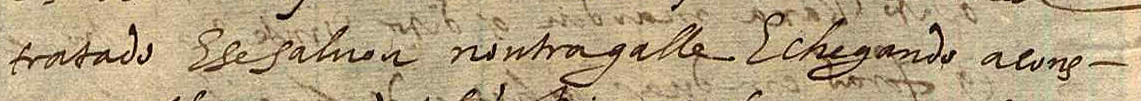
tratado E se saluou noutra galle E chegando a cons
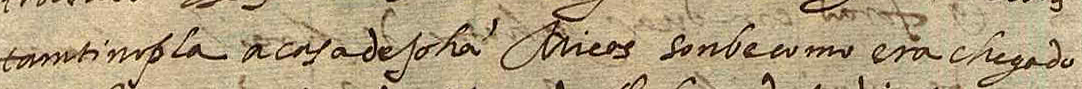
tamtinopla a casa de Johā Micas soube como era chegado
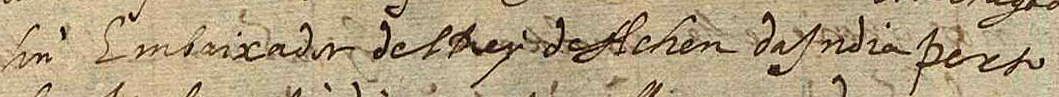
hū Embaixador del Rey de Achen da Jndia perto
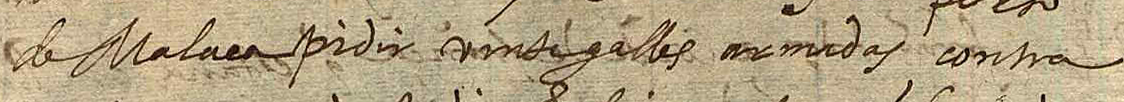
de Malaca pidir vinte galles armadas contra
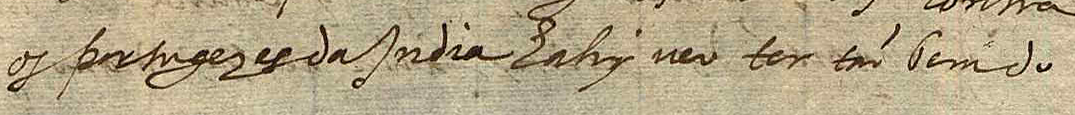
os portugezes da Jndia E ahy ueo ter taõbem do
